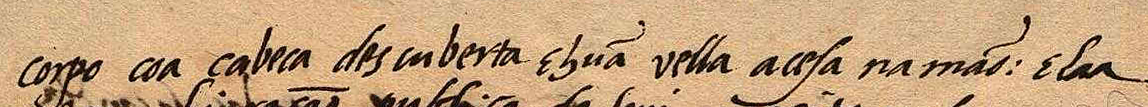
corpo coa cabeça descuberta E huā vella acesa na mão E laa
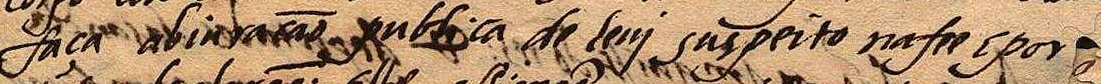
faça abiuração publica de leuj suspeito na fee E por
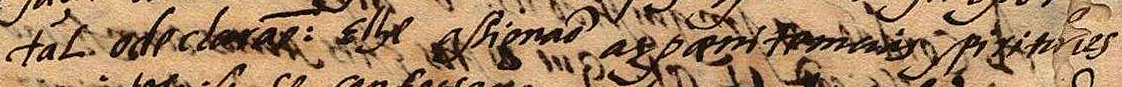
tal o declarão E lhe assignaõ as pœnitemcias spiritu_es
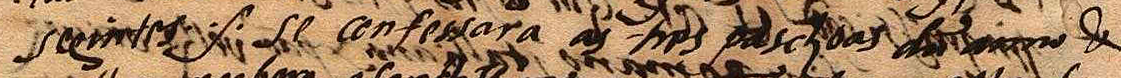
segimtes .s. se confessara as tres paschoas do anno &
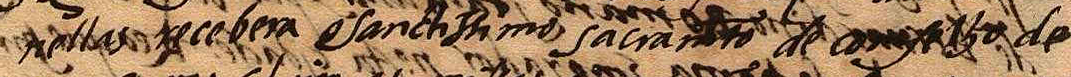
nellas recebera o sanctissimo sacram̄to de conselho de
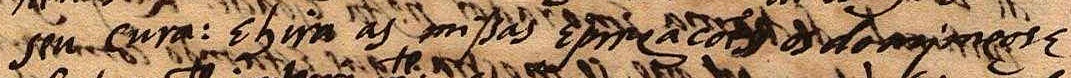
seu cura E hira as missas E pregações os domjmgos E
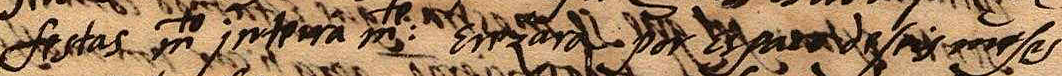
festas mto jnteiramte E rezara por Espaço de seis meses
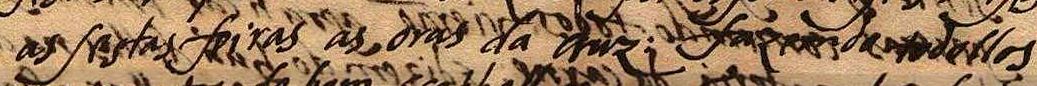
as sestas feiras as oras da cruz fazemdo todollos
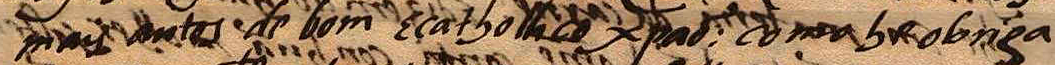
mais autos de bom E cathollico xpaõ como he obriga
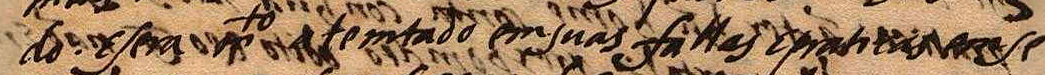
do E sera mto atemtado em suas fallas E praticas em se
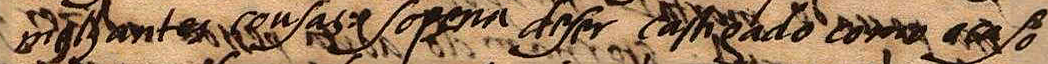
melhantes cousas so pena de ser castigado como o caso
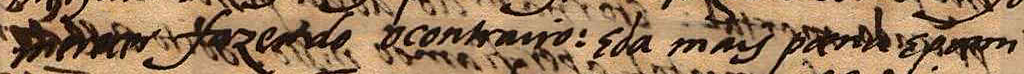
merecer fazemdo o contrairo E da mais pœna E pœni
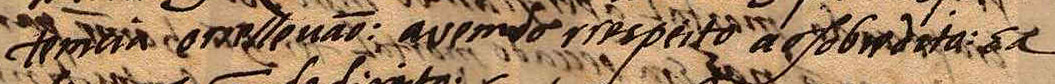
temcia o rrelleuão avemdo rrespeito ao sobredito E a
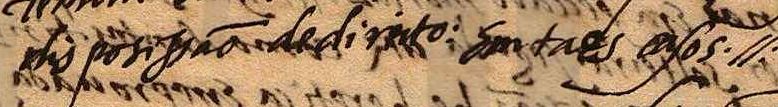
disposissaõ de direito Em taes casos. //
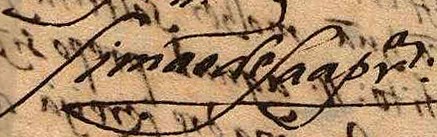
Simão de Saa pra
